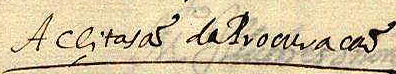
Aceitasaõ da Procuraçaõ
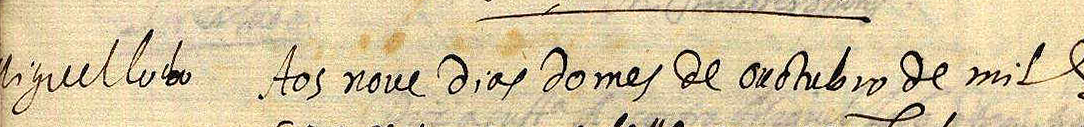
Miguel lobo Aos noue dias do mes de outubro de miL E
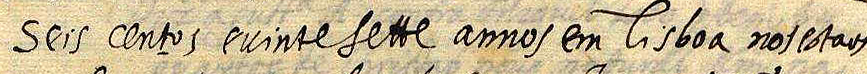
Seiscentos e uinte sette annos em lisboa nos estaos
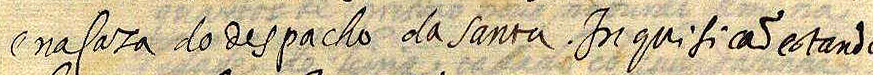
en a Caza do despacho da santa Jnquisicaõ estando
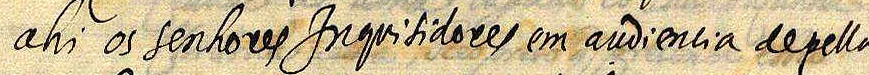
ahi os senhores Jnquisidores em audiencia de pella
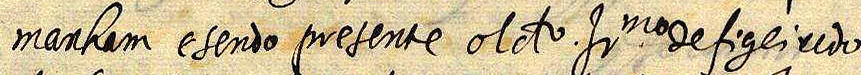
manham e sendo presente o ldo. Jrm.o de figeiredo
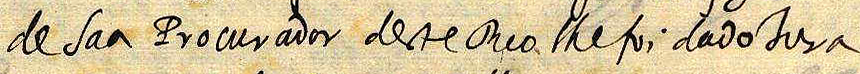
de Saa Procurador deste Reo lhe foi dado Iura
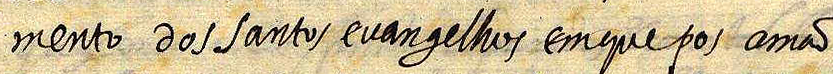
mento dos Santos euangelhos em que pos a maõ
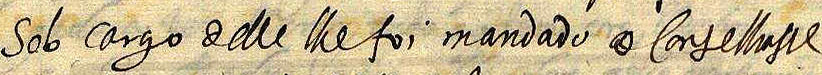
Sob cargo delle lhe foi mandado o Conselhasse
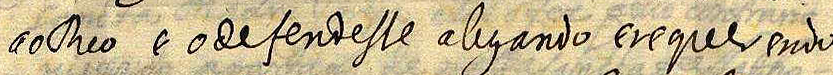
ao Reo e o defendesse alegando e requerendo
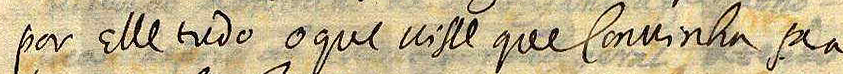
por Elle tudo o que uisse que Conuinha pa
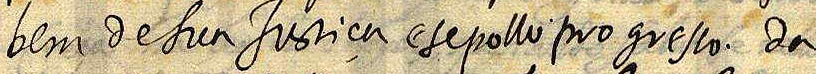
bem de sua Justiça e se pollo progresso. da
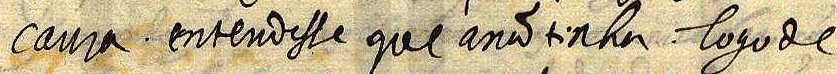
cauza entendesse que a naõ tinha. logo de
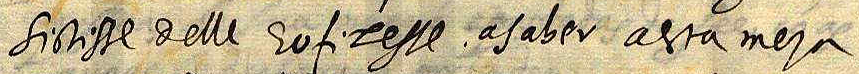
sistisse delle E o fizesse a saber a esta meza
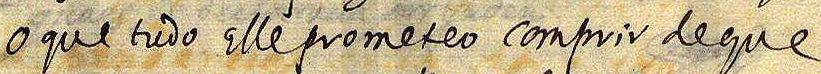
o que tudo Elle prometeo comprir de que
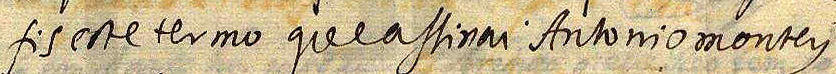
fis este termo que assinou Antonio montey
